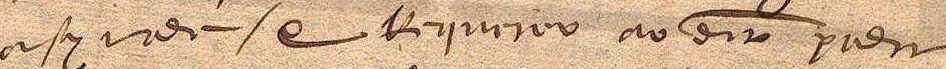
asynada / e Requereo ao dito padre
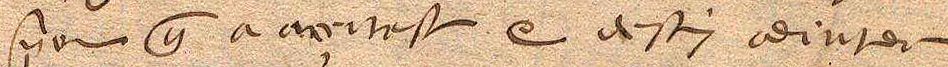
pior q̄ a açeitase e desse a deujda
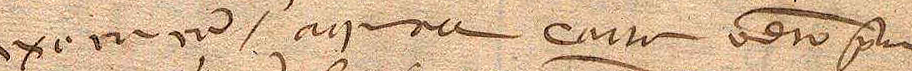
execuçā / a quall carta o d̄to p̄or
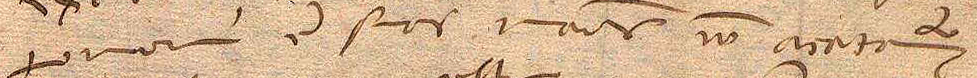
tomou ē suas maõs c̄o acatamto
